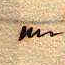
iur
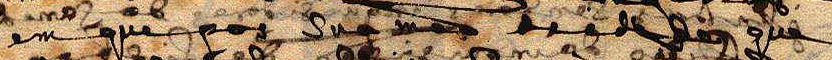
em que pos sua mão de idade que
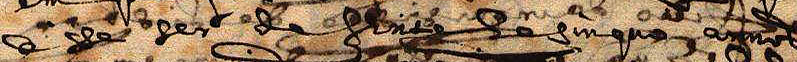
disse ser de Vinte he sinquo annos
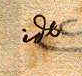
ide
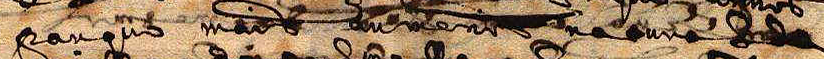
pouquo mais ou menos natural da
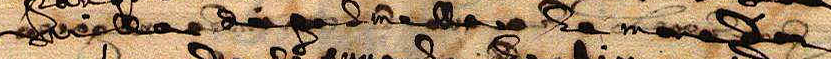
uilla de palmella he morador
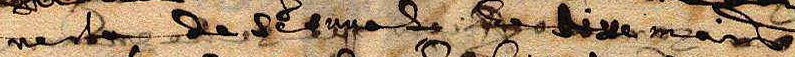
nesta de setuual he disse mais
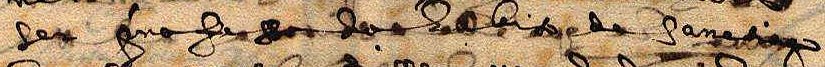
ser professo do habito de Sanctiago
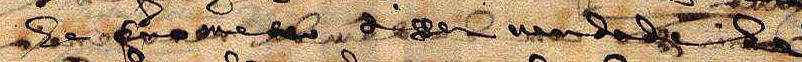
he prometeo disser uerdade he
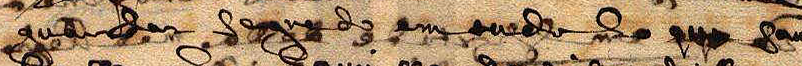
guardar segredo em tudo ho que sou
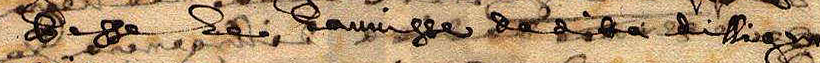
besse he houuisse da dita dilligen
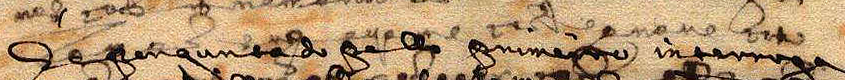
he perguntado pello primeiro interroga
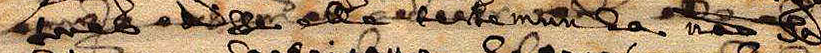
torio disse elle testemunha não sa
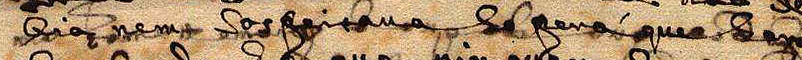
bia nem sospeitaua ho pera que hera
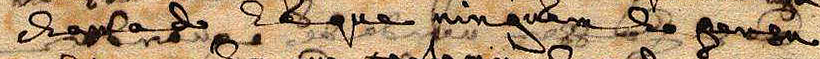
chamado he que ninguem ho persu
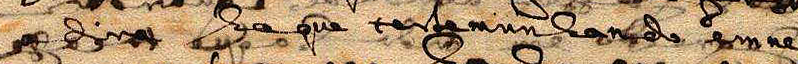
adira ha que testemunhando em ne
